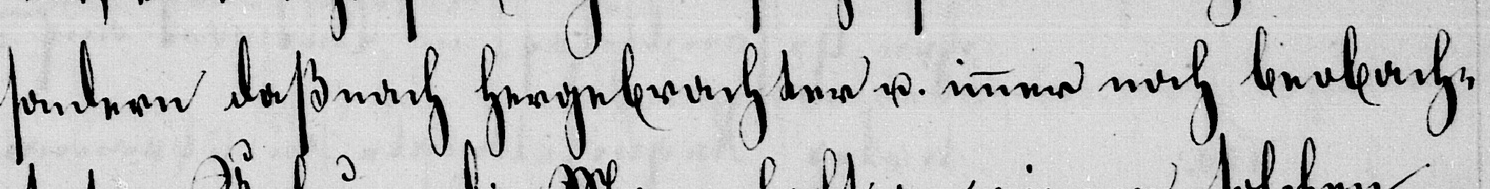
sondern daß nach hergebrachter u. immer noch beobach¬
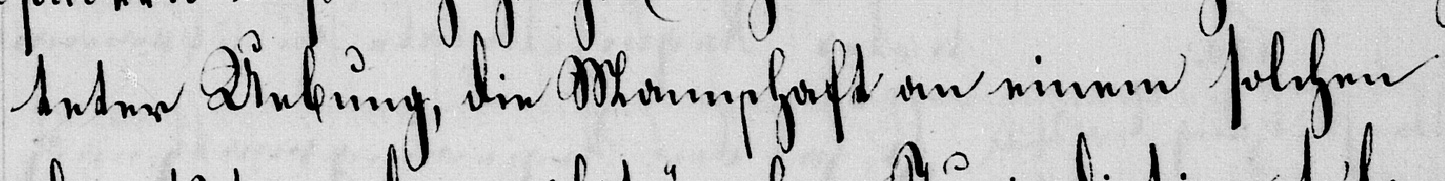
teter Uebung, die Mannschaft an einem solchen
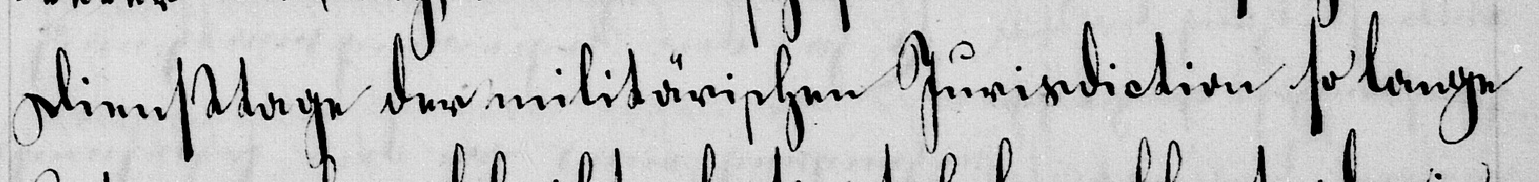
Diensttage der militärischen Jurisidictive so lange
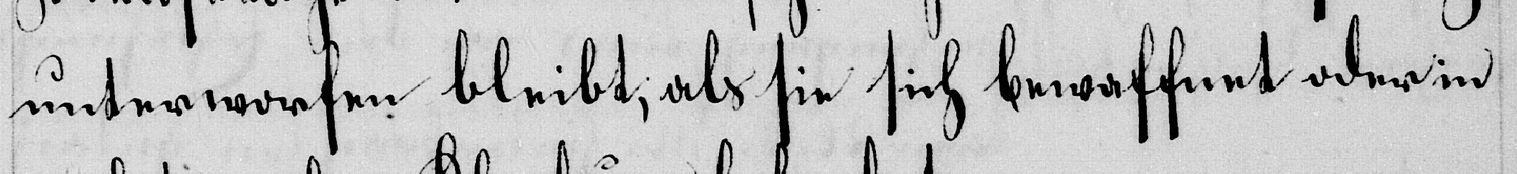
unterworfen bleibt, als sie sich bewaffnet oder in
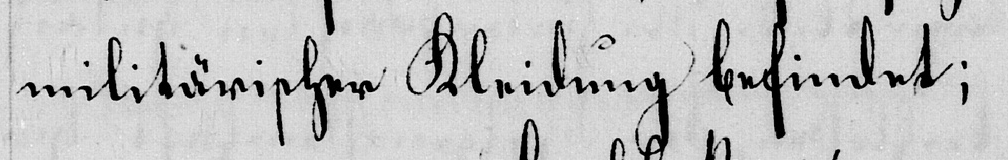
militärischer Kleidung befindet;
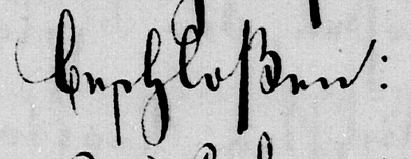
beschloßen:
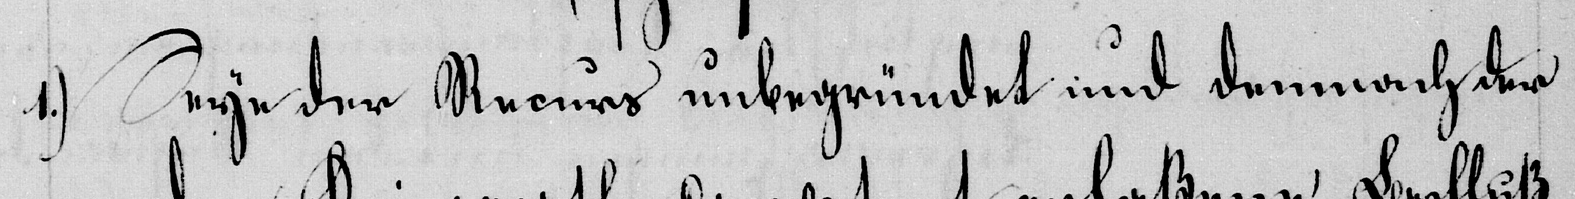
1.) Sey der Recurs unbegründet und demnach der
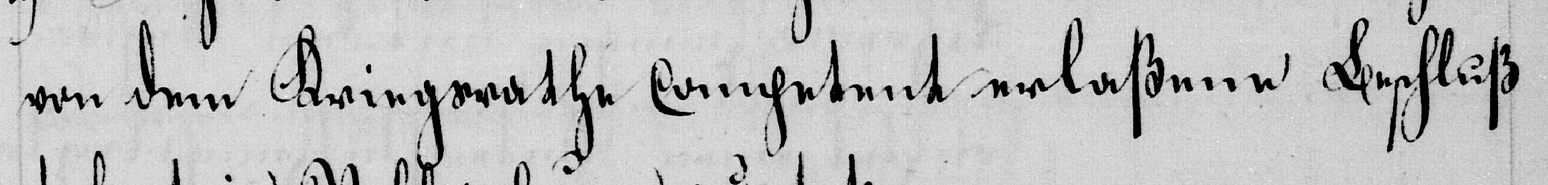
von dem Kriegsrathe competent erlaßene Beschluß
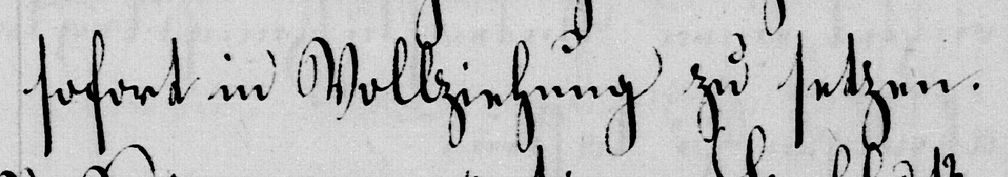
sofort in Vollziehung zu setzen.
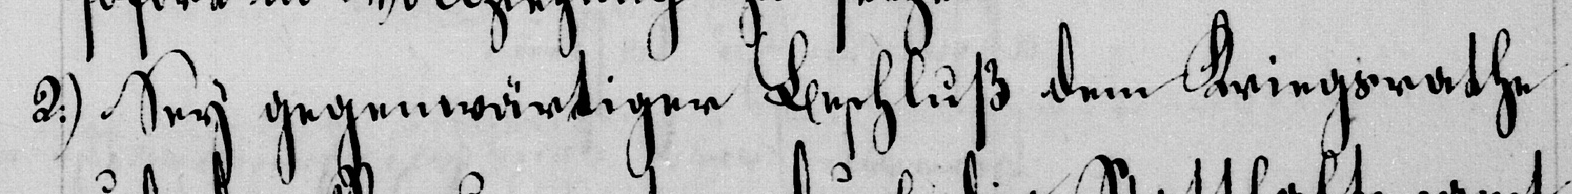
2.) Sey gegenwärtiger Beschluß dem Kriegsrathe
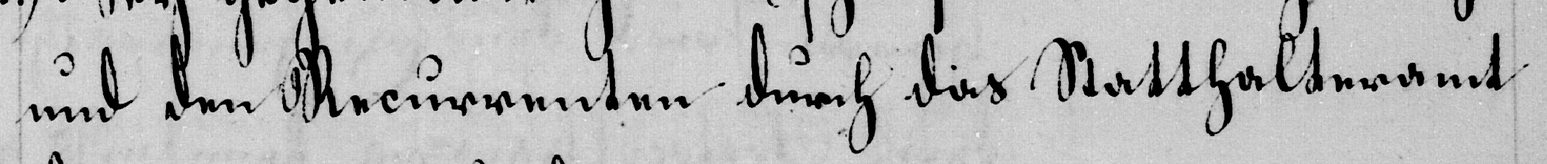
und den Recurrenten durch das Statthalteramt
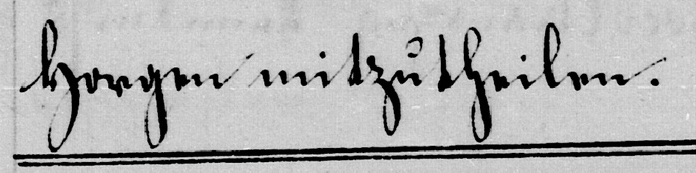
Horgen mitzutheilen.
